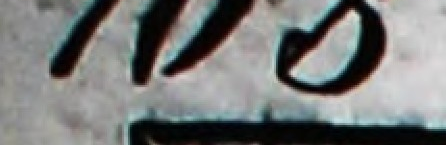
768
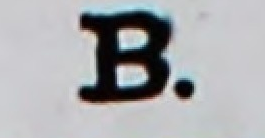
B.
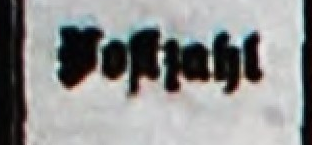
Postzahl
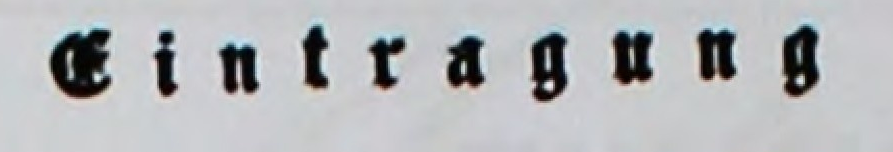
Eintragung
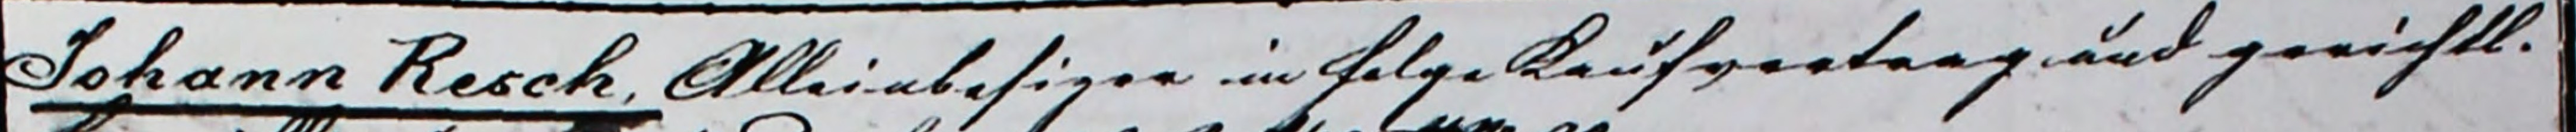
Johann Resch, Alleinbesiger in Felge Kaufvertrag und gerichtl.
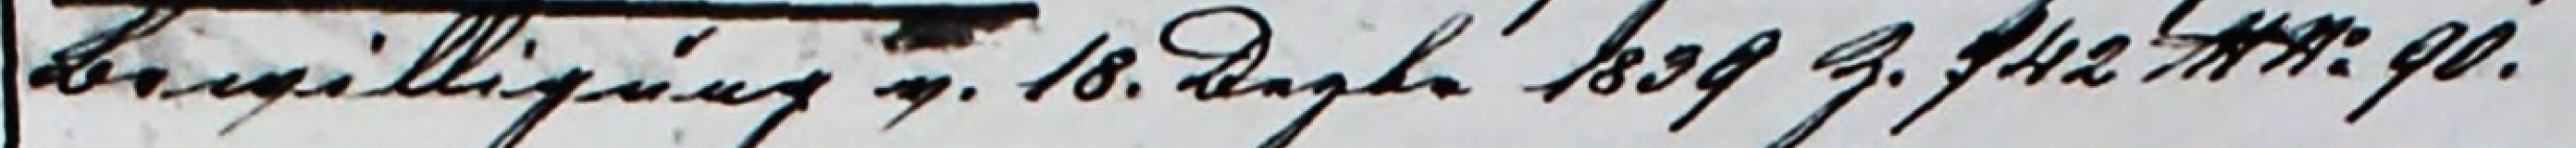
Bewilligung v. 18. Dezbr 1839 Z. 742 No 90.
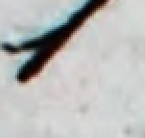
1
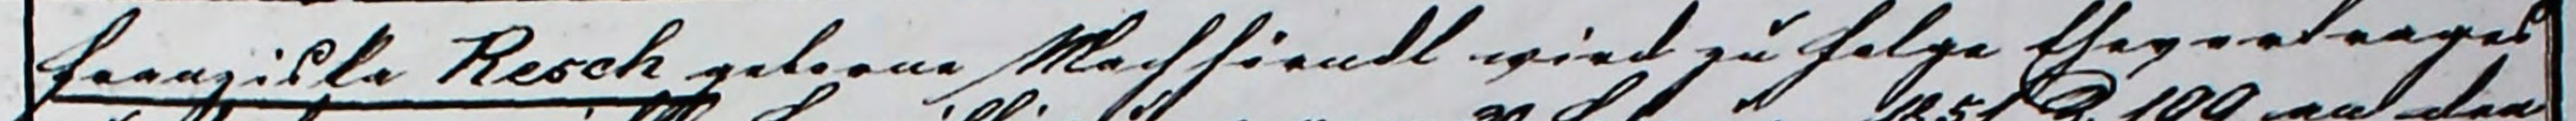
Franziska Resch geborne Machhörndl wird zu Felge Elevertrages
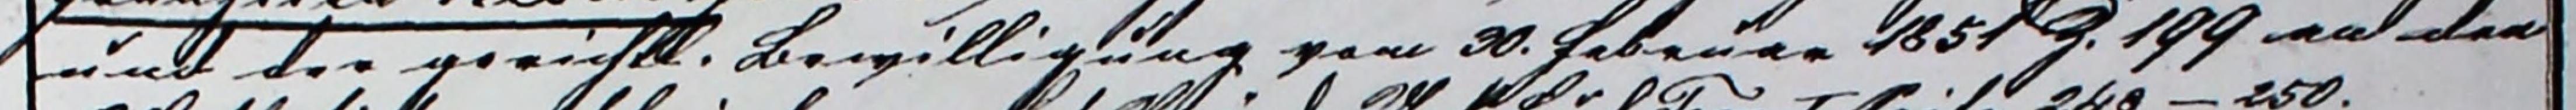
und der gerichtl. Bewilligung vom 30. Februar 1851 Z. 199 an den
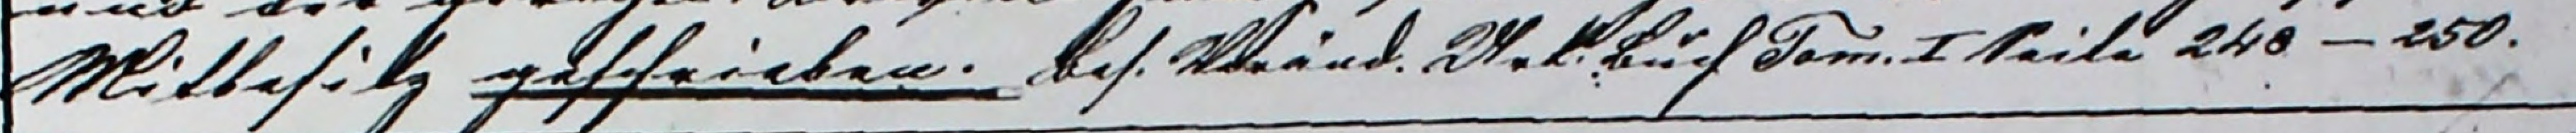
Mitbesitz geschrieben. Bes. Veränd. Urk. Buch Tom. I Seile 240 - 250
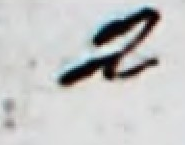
2
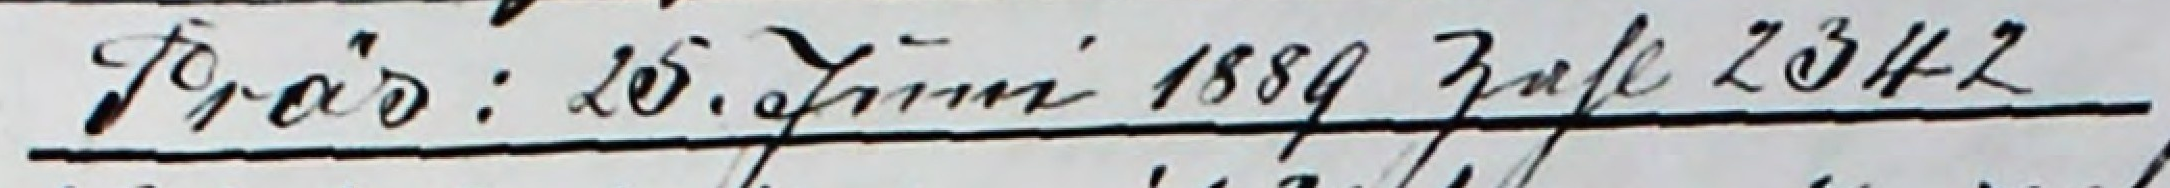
Präs: 25. Juni 1889 Zahl 2342
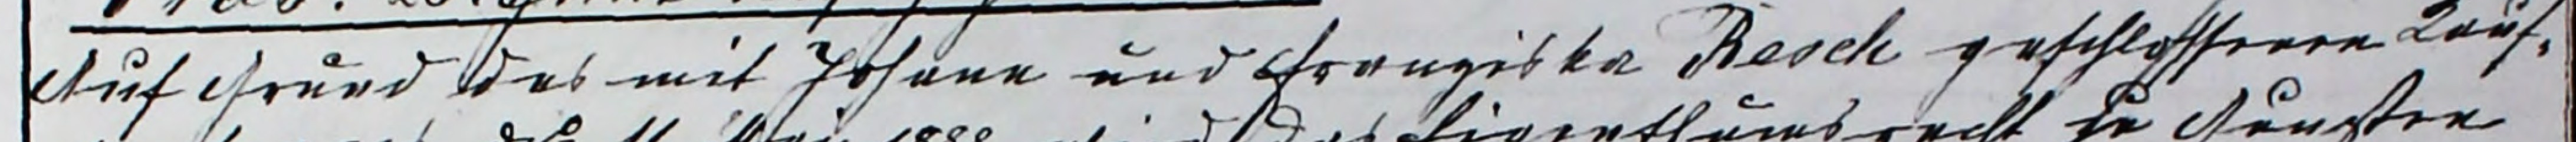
Auf Grund des mit Johann und Franziska Resch geschlossenen Kauf„
